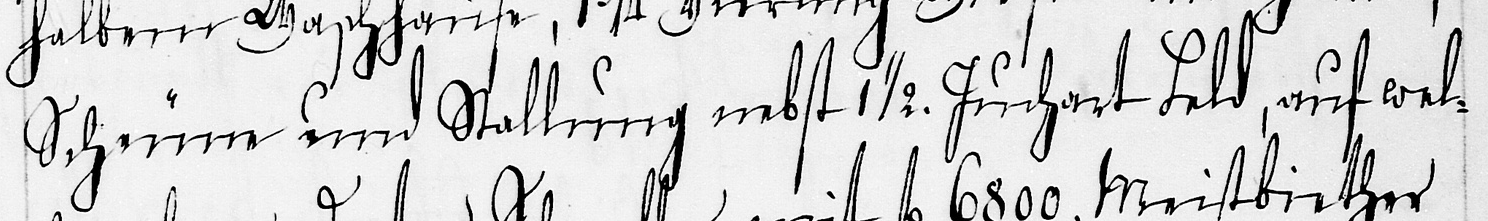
Scheune und Stallung nebst 1 1/2. Juchart Fel¬
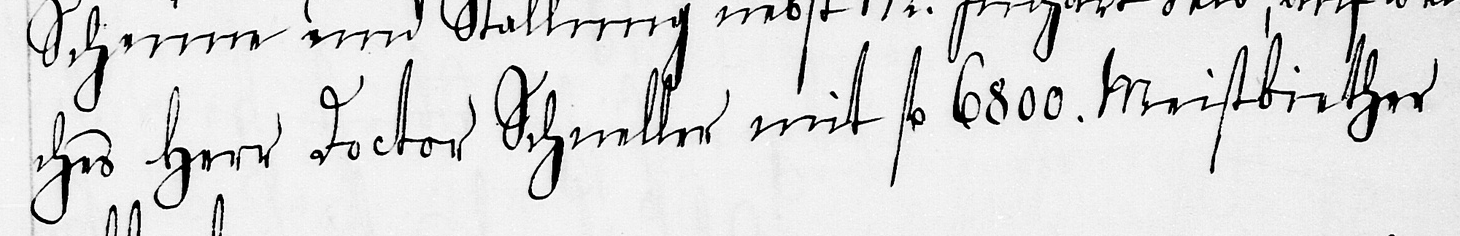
ches Herr Doctor Schneller mit fl 6800. Meistbiether
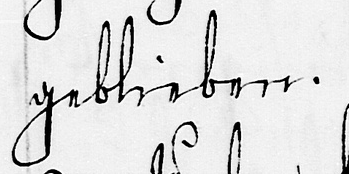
geblieben.
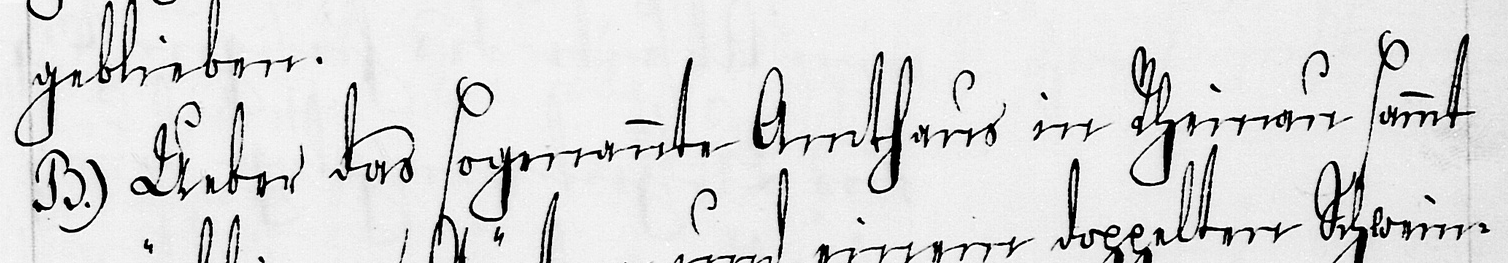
B.) Ueber das sogenannte Amthaus in Rheinau sammt
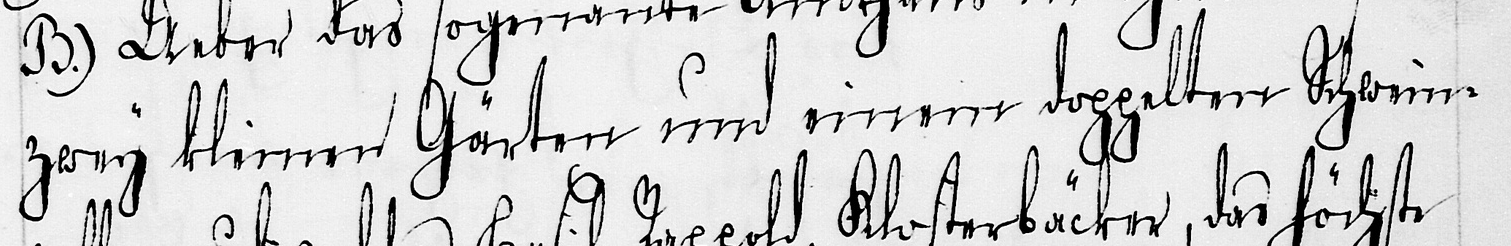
zwey kleinen Gärten und einem doppelten Schwein¬
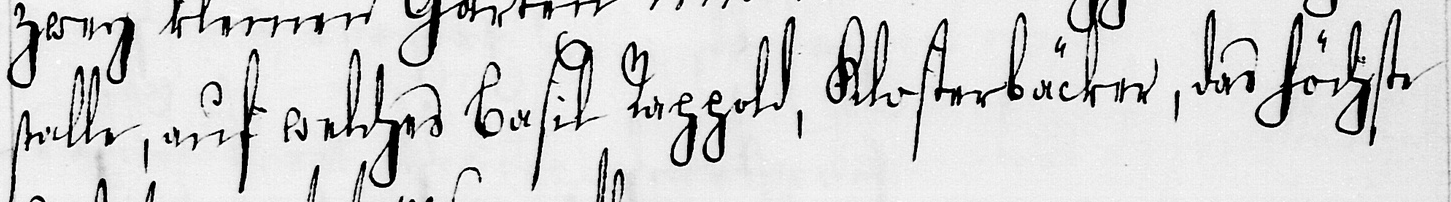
alle, auf welches Basil Rappold, Klosterbäcker, das höchste
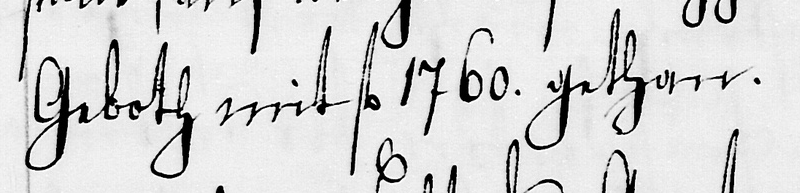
Geboth mit fl 1760. gethan.
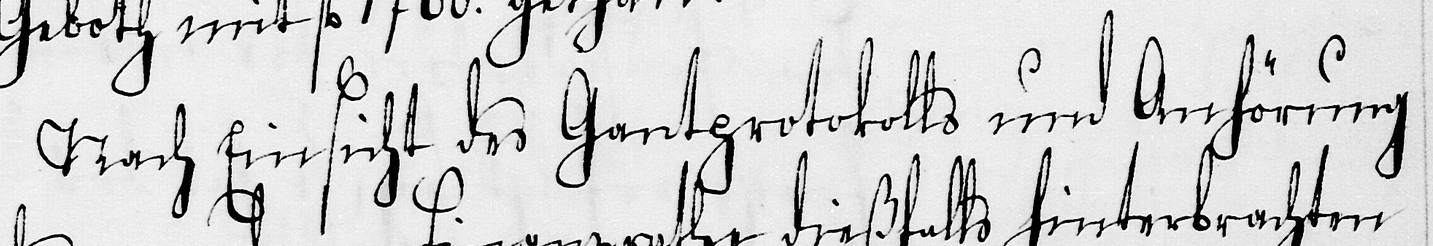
Nach Einsicht des Gantprotokolls und Anhörung
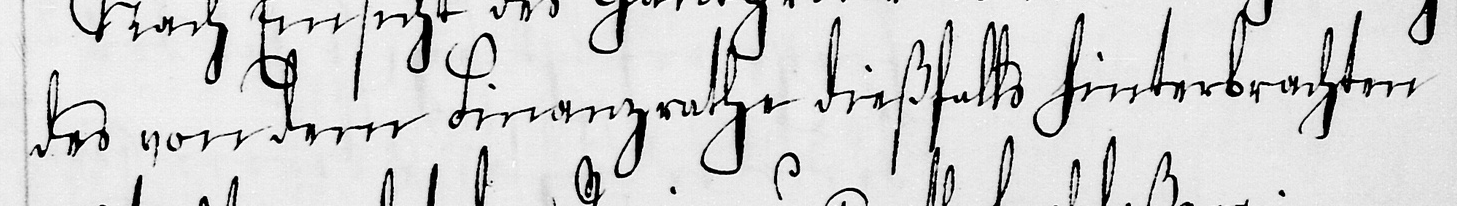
des von dem Finanzrathe dießfalls hinterbrachten
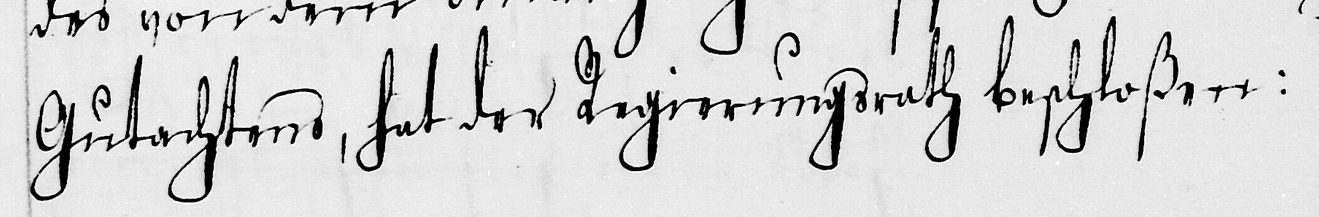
Gutachtens, hat der Regierungsrath beschloßen:
